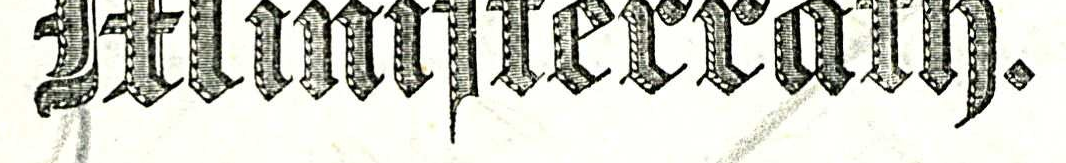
Ministerrath
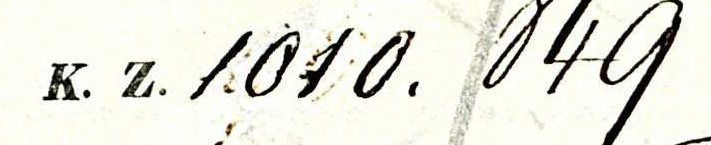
KZ 1010.[1]849
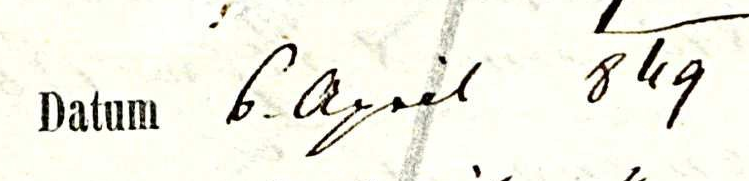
Datum 6. April[1]849
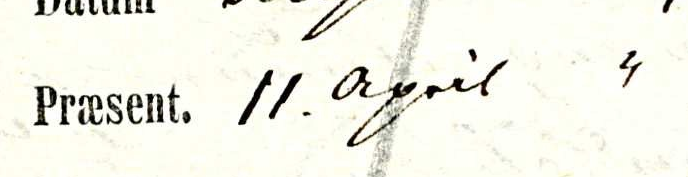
Praesent. 11. April [1]849
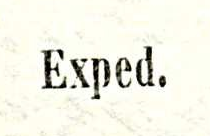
Exped.
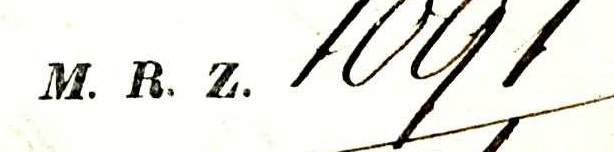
M.R. Z. 1091
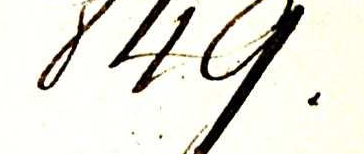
849
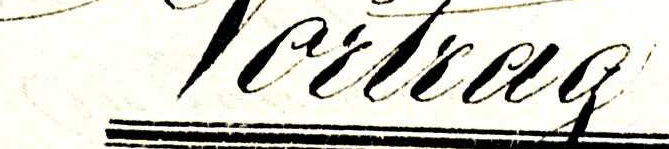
Vortrag
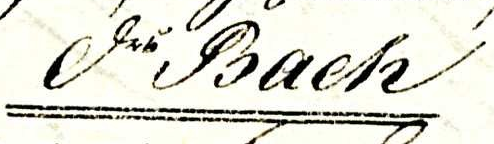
Dr. Bach
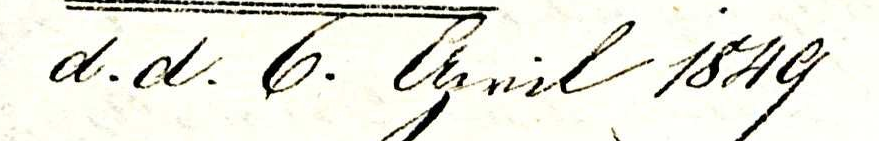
d.d. 6. April 1849
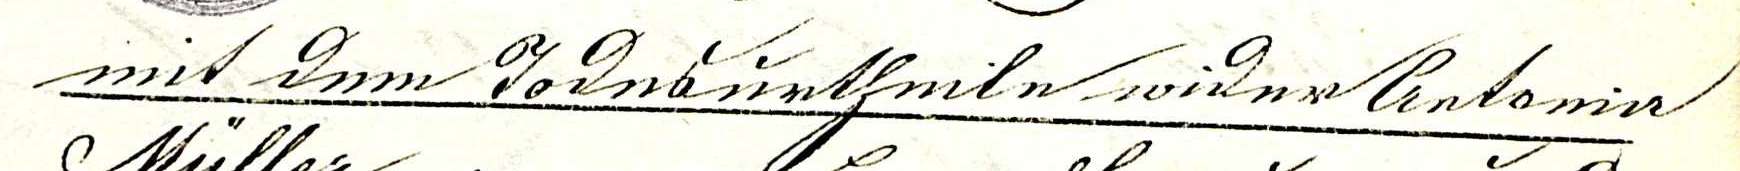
mit dem Todesurtheile wider Antonia
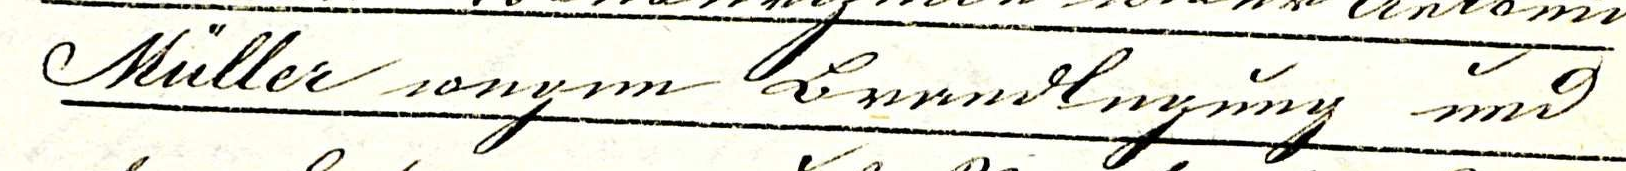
Müller wegen Brandlegung und
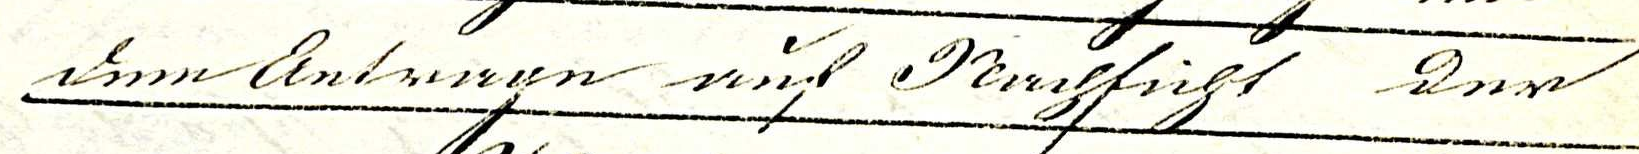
dem Antrage auf Nachsicht der
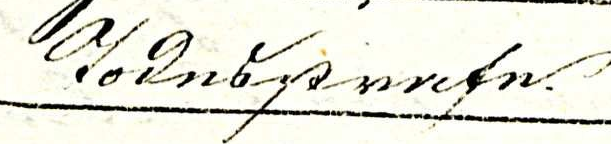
Todesstrafe.
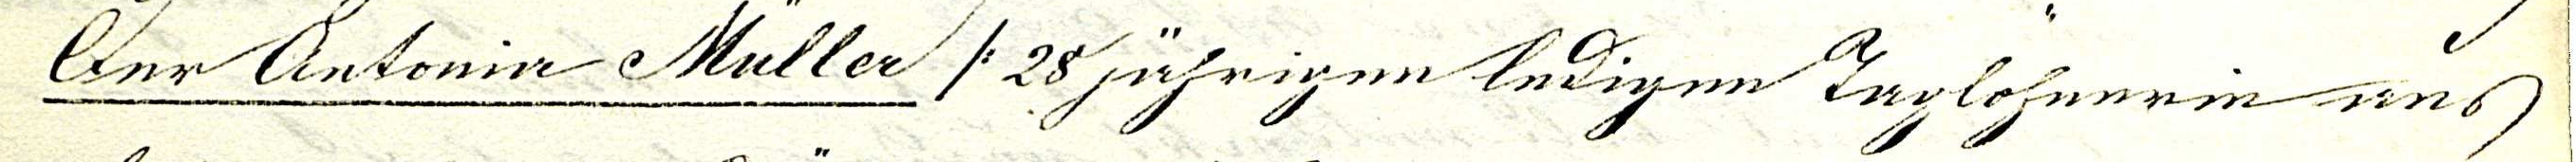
Der Antonia Müller (28jährigen ledigen Taglöhnerin aus
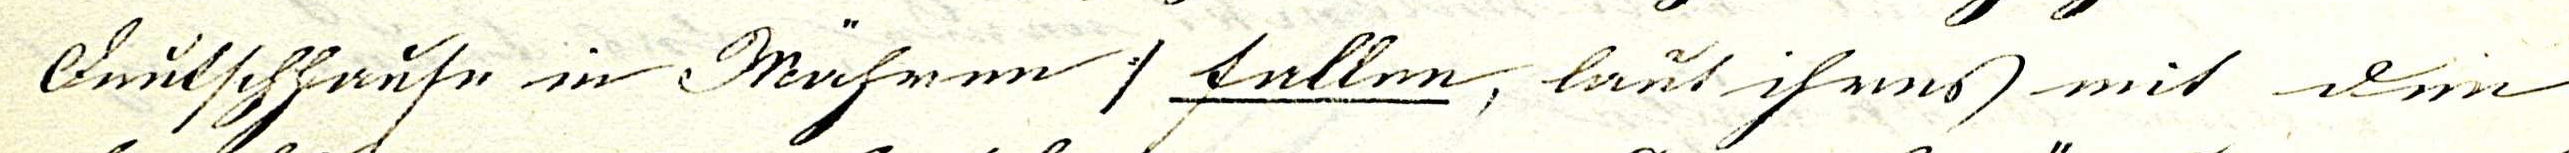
Deutschhause in Mähren) fallen, laut ihres mit dem
